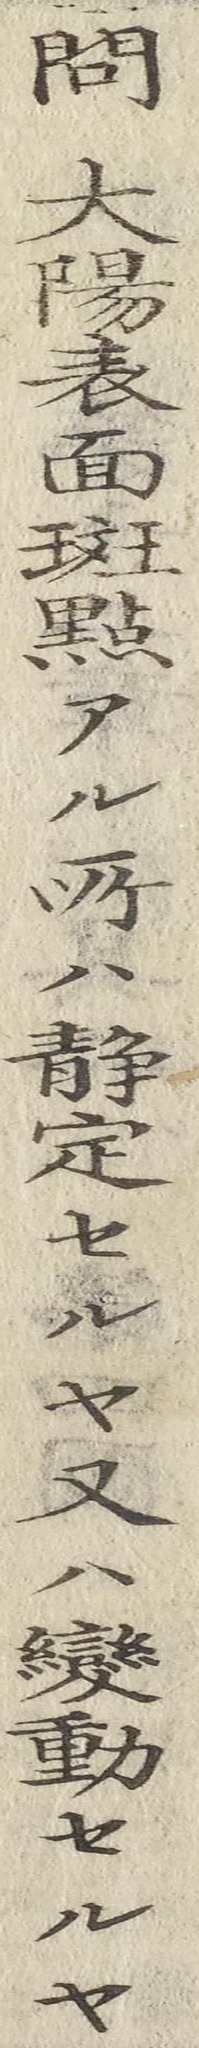問大陽表面斑点アル所ハ静定セルヤ又ハ変動セルヤ
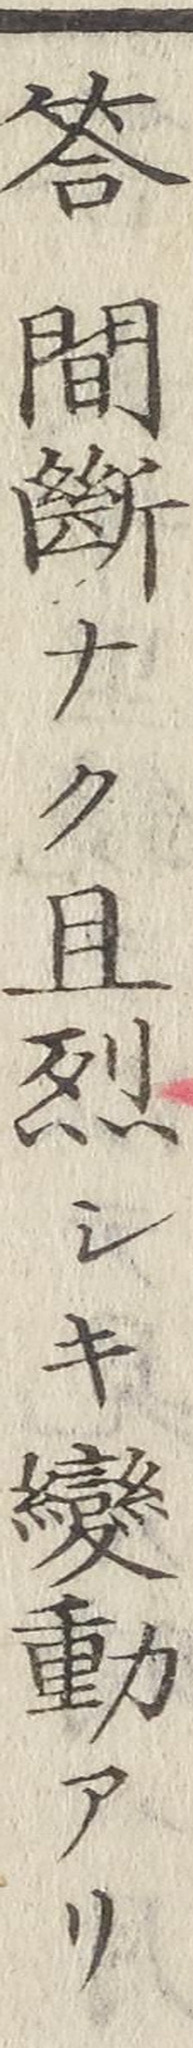答間断ナク且烈シキ変動アリ
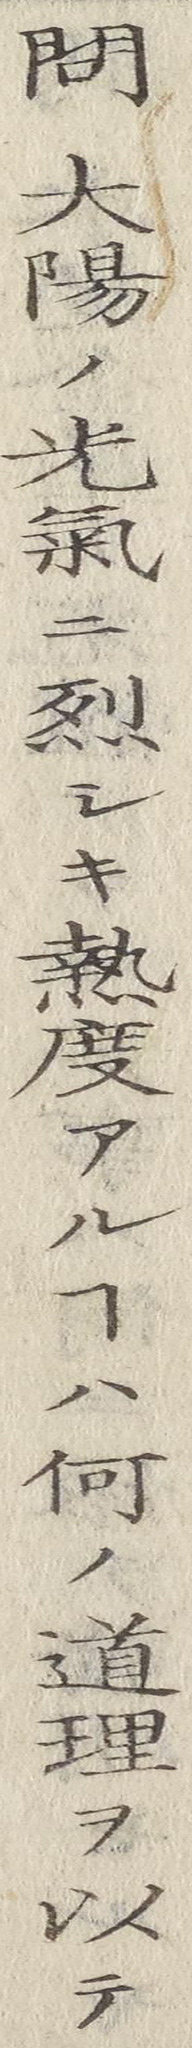問大陽ノ光気ニ烈シキ熱度アルコトハ何ノ道理ヲ以テ
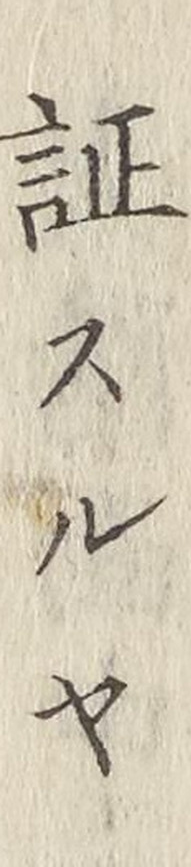証スルヤ
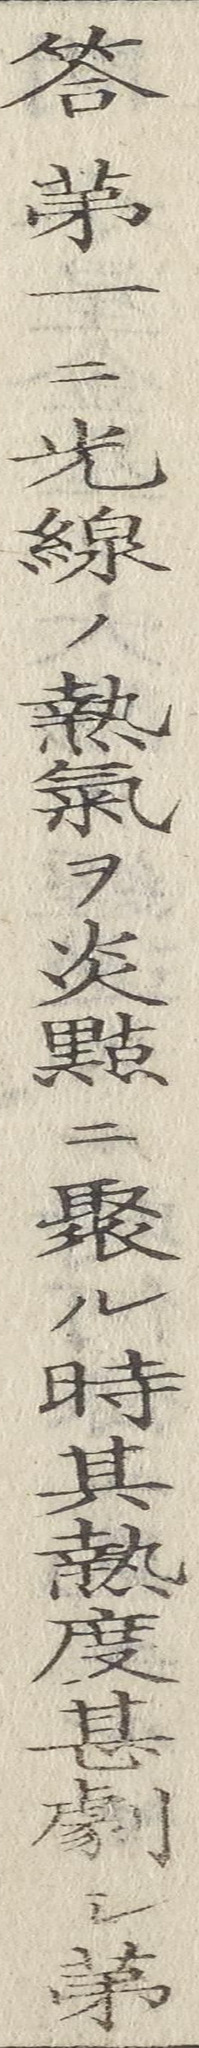答第一ニ光線ノ熱気ヲ炎点ニ聚ル時其熱度甚劇シ第
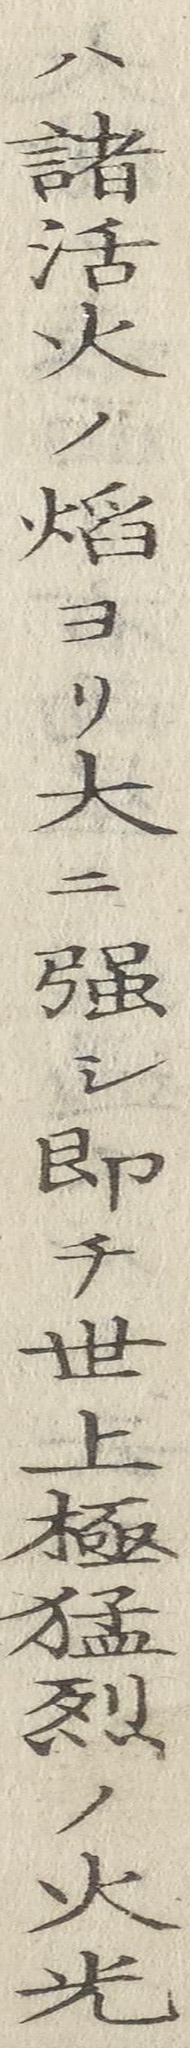ハ諸活火ノ焔ヨリ大ニ強シ即チ世上極猛烈ノ火光
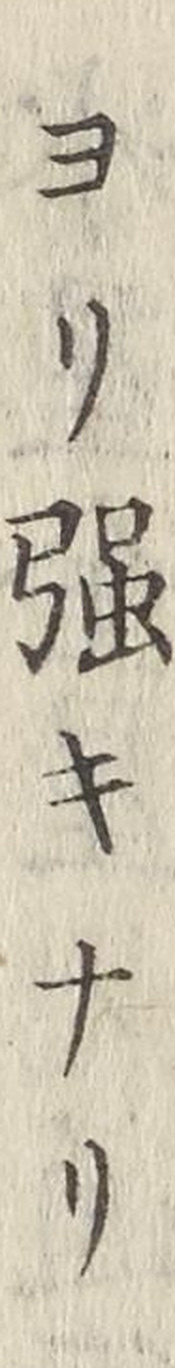ヨリ強キナリ
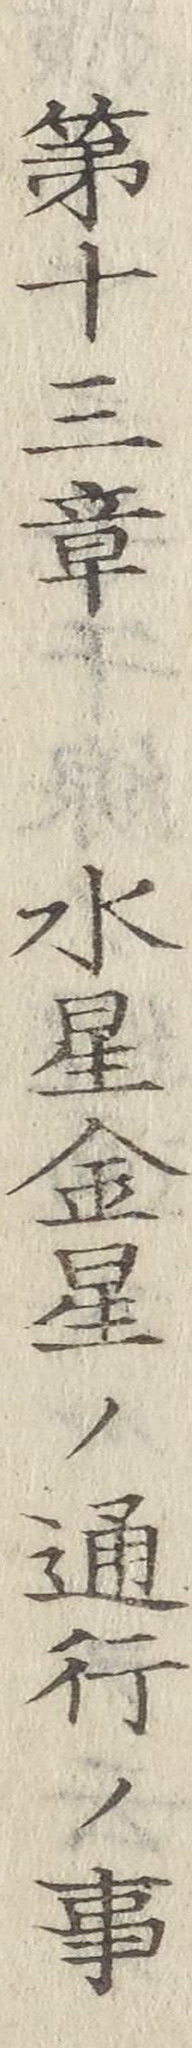第十三章水星金星ノ通行ノ事
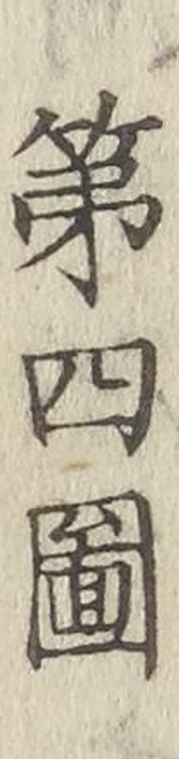第四図

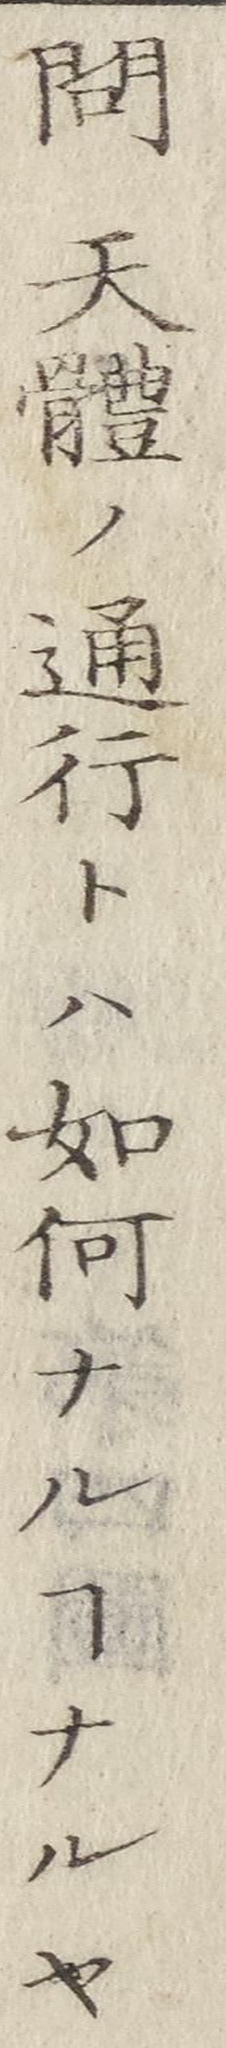問天体ノ通行トハ如何ナルコトナルヤ
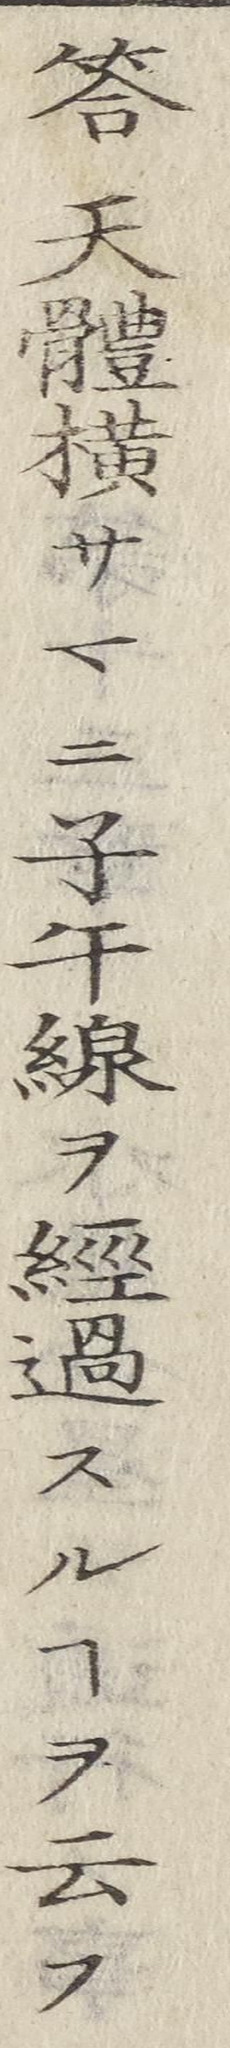答天体横サマニ子午線ヲ経過スルコトヲ云フ
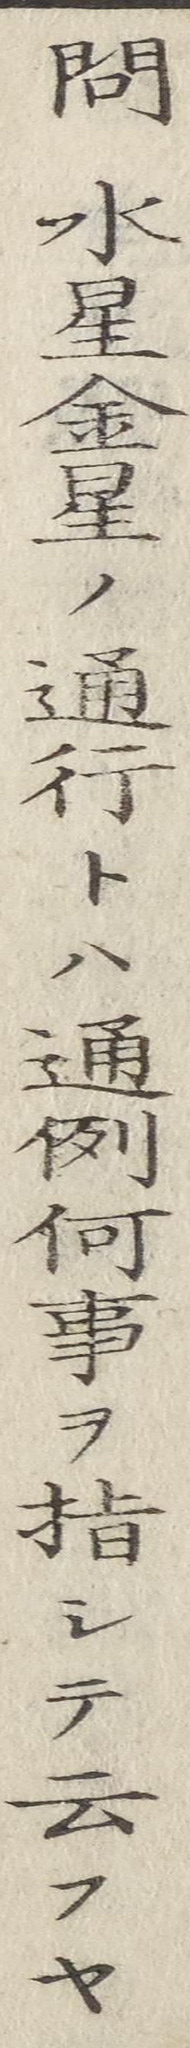問水星金星ノ通行トハ通例何事ヲ指シテ云フヤ
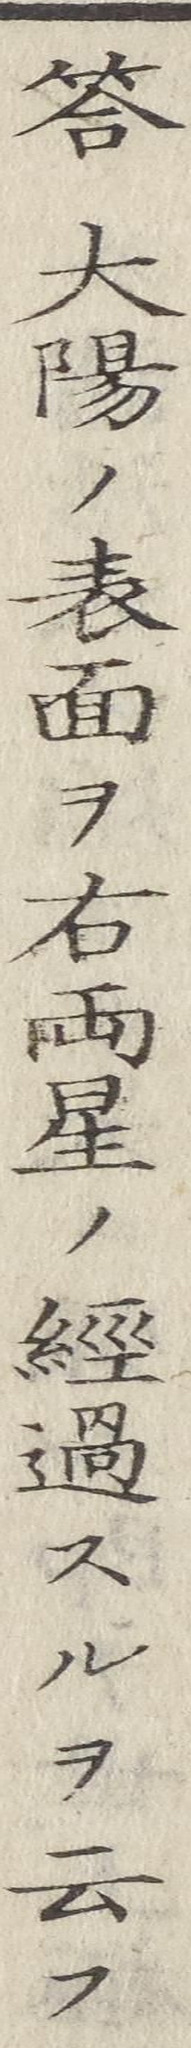答大陽ノ表面ヲ右両星ノ経過スルヲ云フ
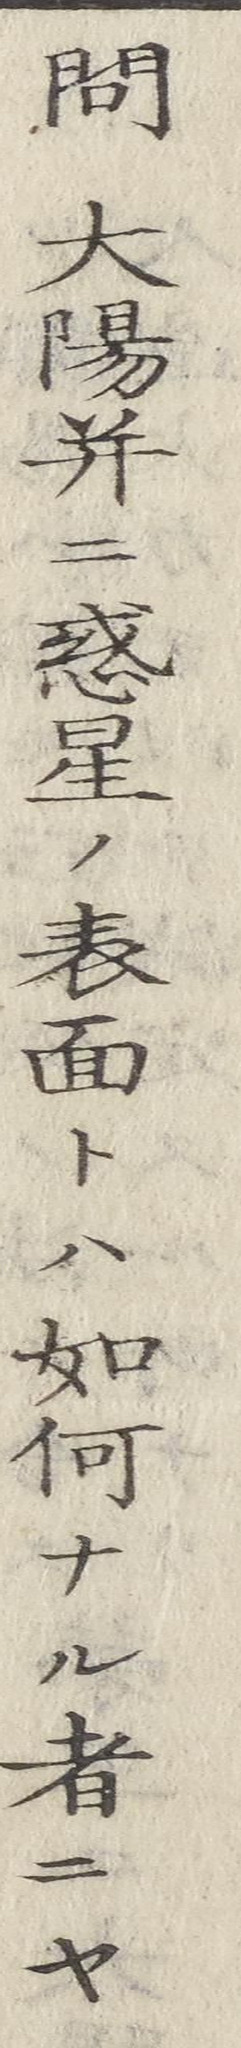問大陽幷ニ惑星ノ表面トハ如何ナル者ニヤ
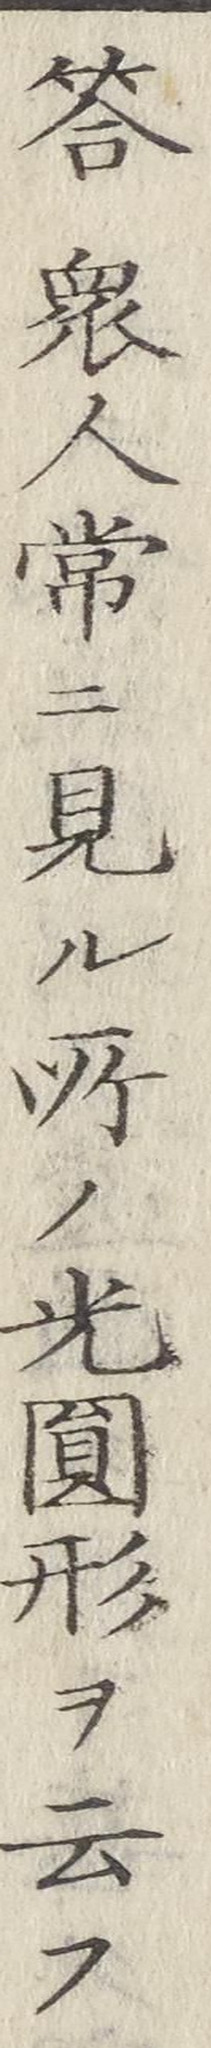答衆人常ニ見ル所ノ光円形ヲ云フ
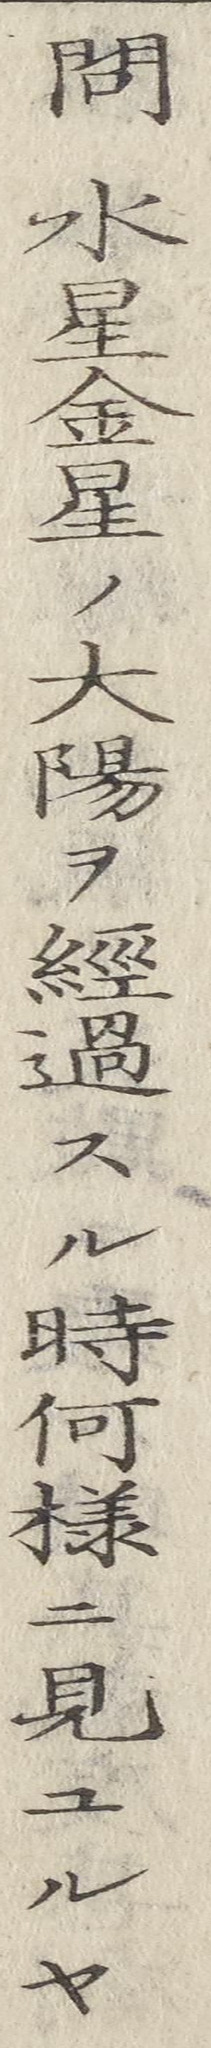問水星金星ノ大陽ヲ経過スル時何様ニ見ユルヤ
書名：星学圖説　上
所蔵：東京大学地震研究所図書室 Earthquake Research Institute Library, The University of Tokyo, JAPAN
